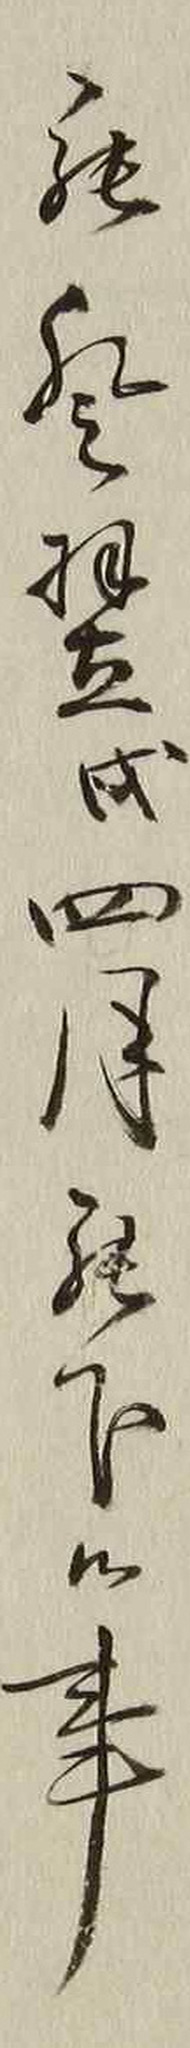罷登翌戌四月罷下候事
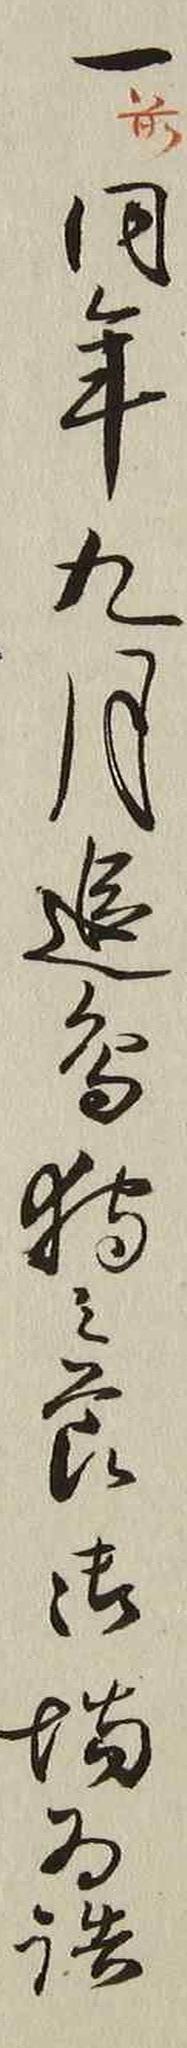一前同年九月追鳥狩之節御場為詰
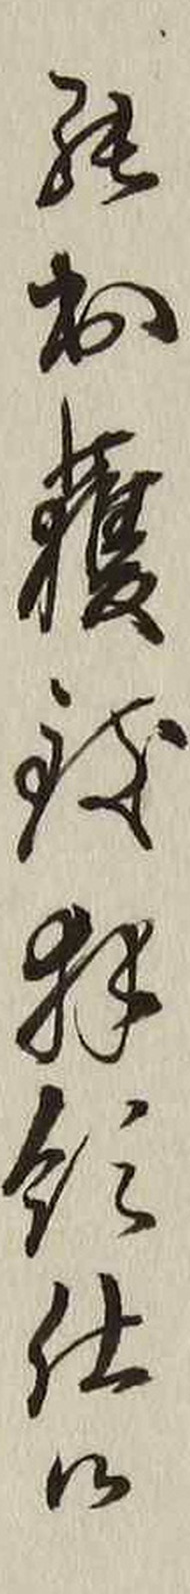罷出獲致拝領仕候
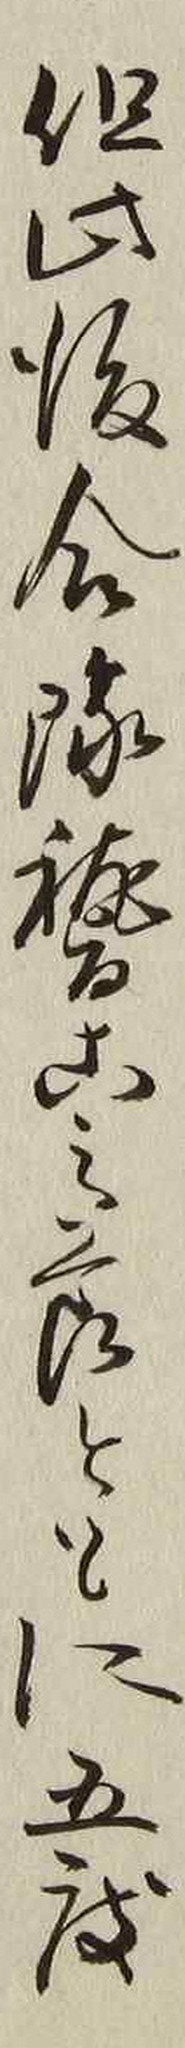但此後合体稽古之節ともに五度
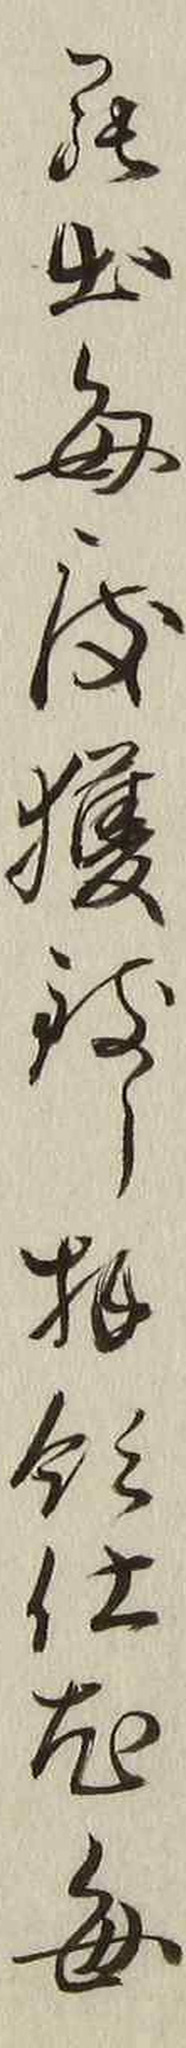罷出毎度獲致し拝領仕尤毎
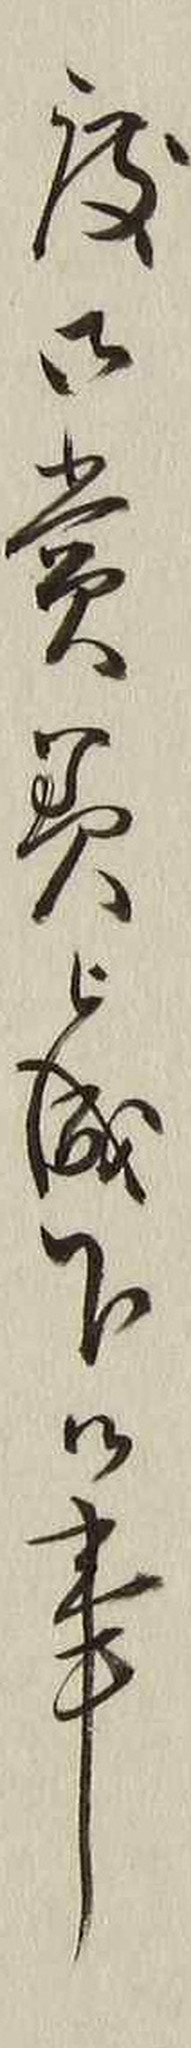度御賞美被成下候事
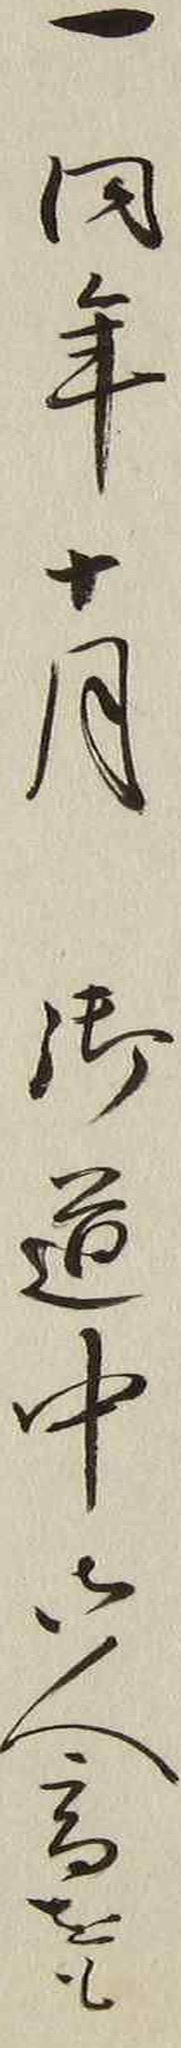一同年十月御道中御人高をも
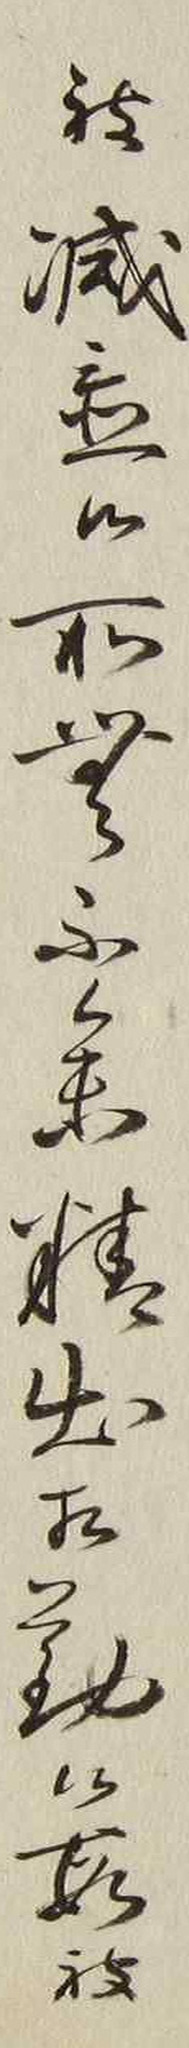被減置候所無不参精出相勤候段被
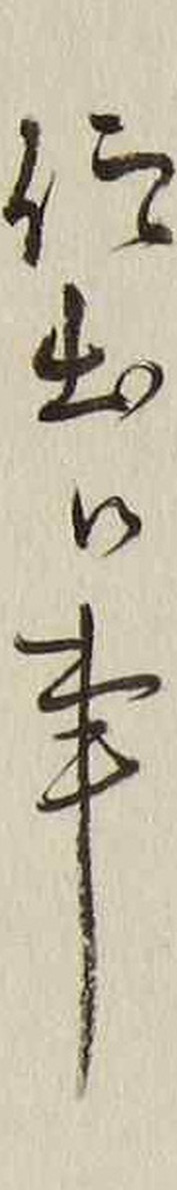仰出候事
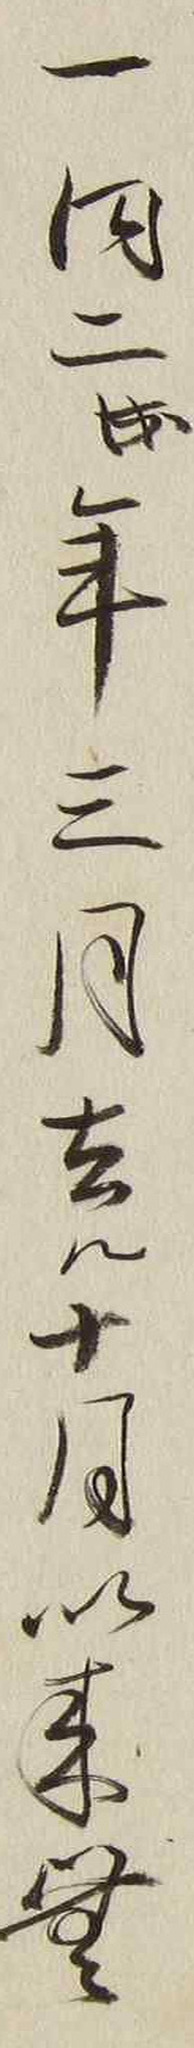一同二戌年三月去ル十月以来無
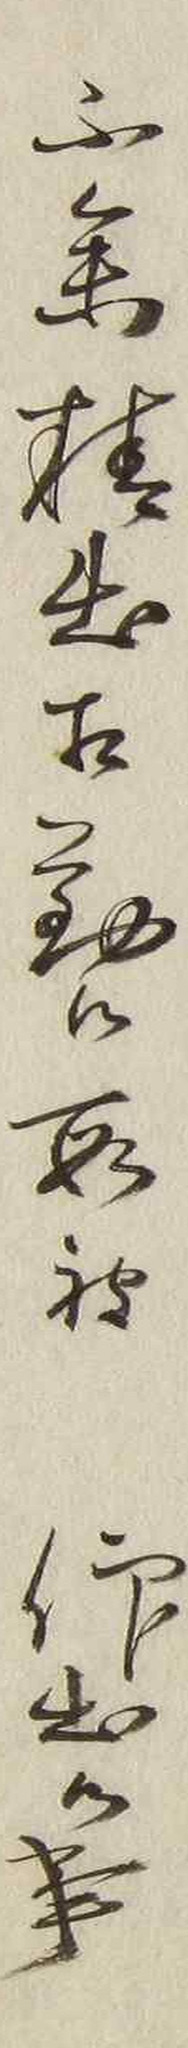不参精出相勤候段被仰出候事
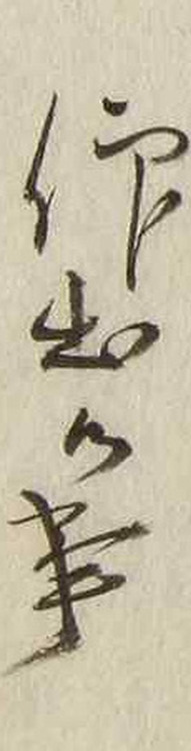仰出候事

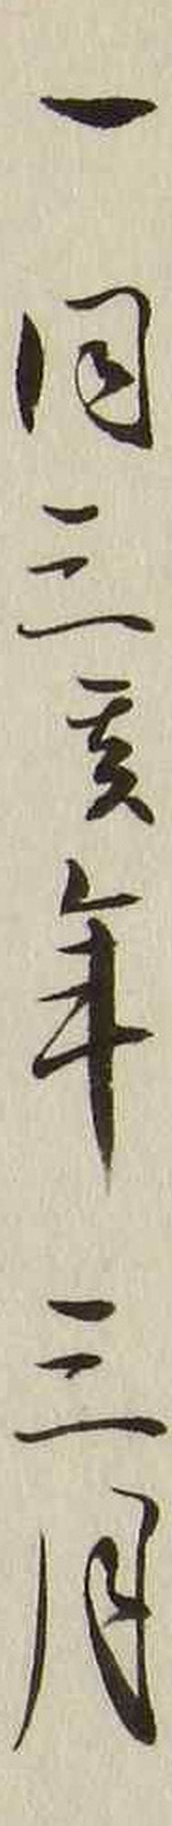一同三亥年三月
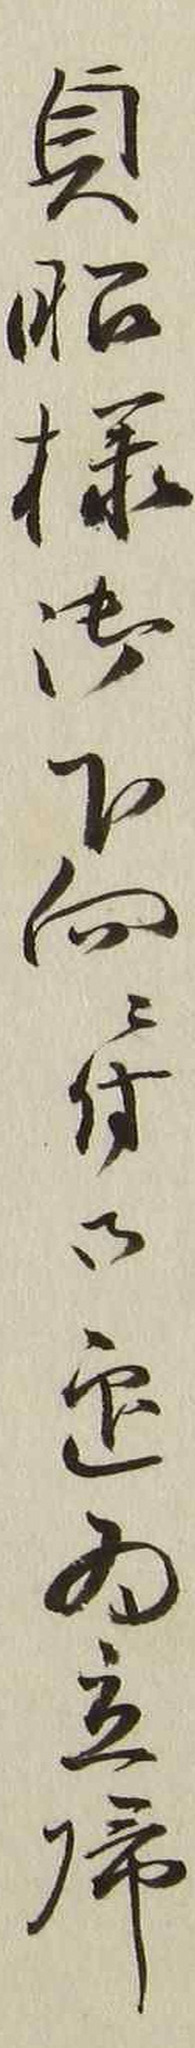貞昭様御下向ニ付御迎為立帰
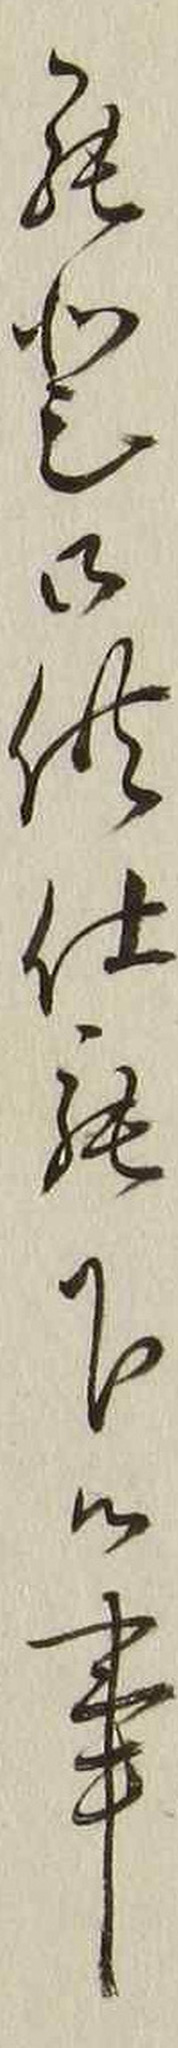罷登御供仕罷下候事
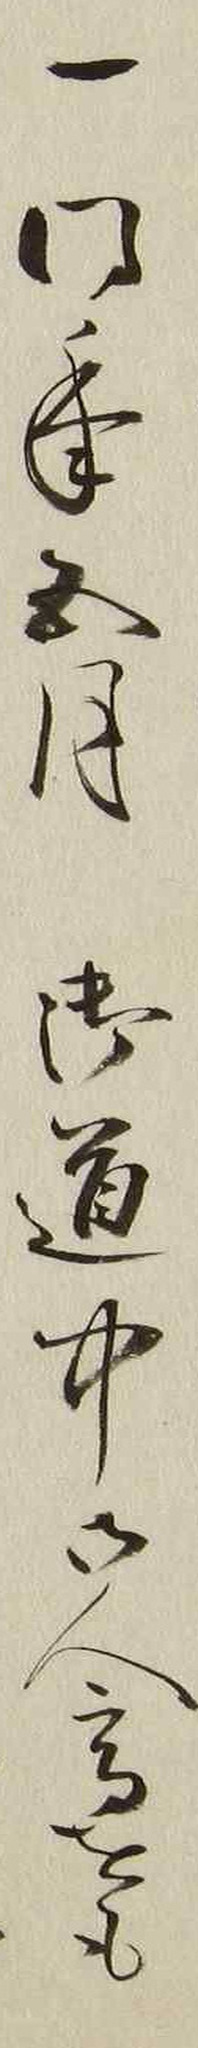一同年五月御道中御人高をも
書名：諸士系譜　巻之163　な之部5
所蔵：会津若松市立会津図書館
